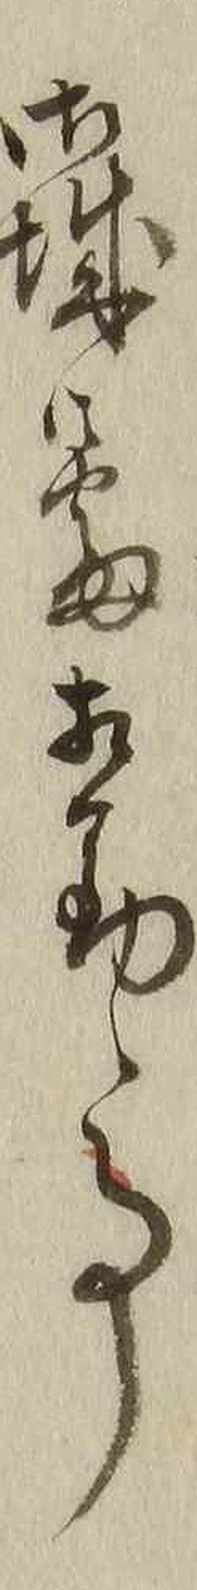御城御番相勤候事
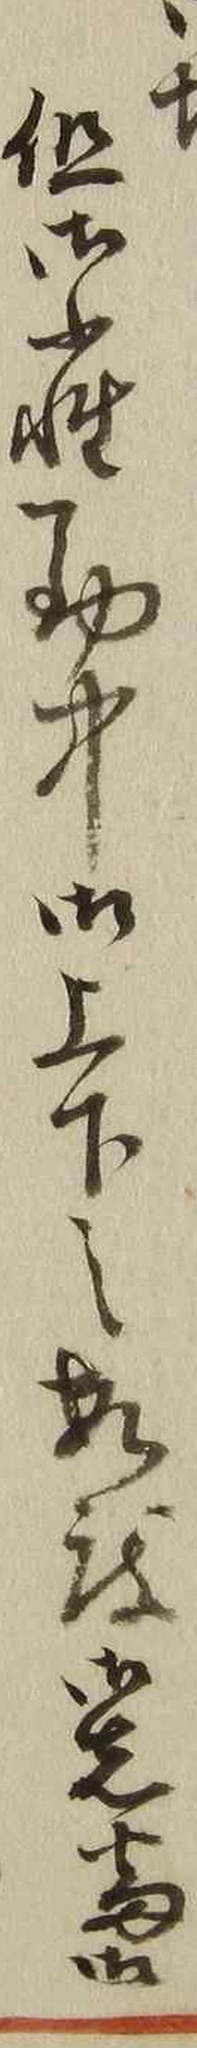但御小性勤中御上下之故度御先番御
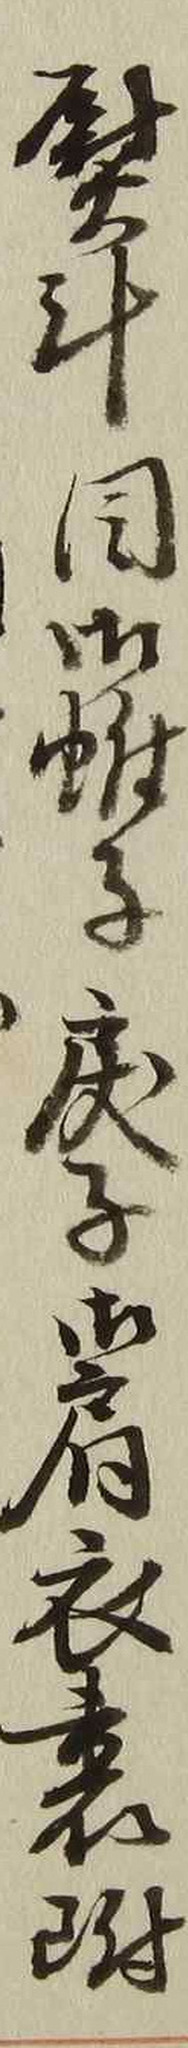熨斗目御帷子戻子御肩衣裏附
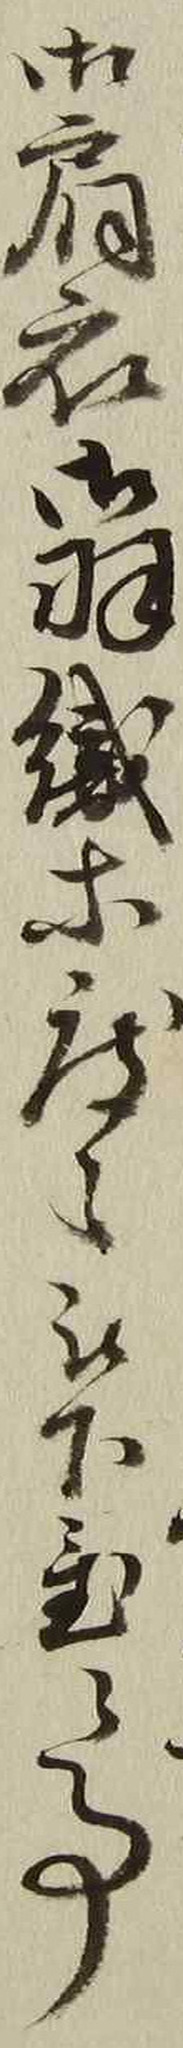御肩衣御羽織等度々被下置候事
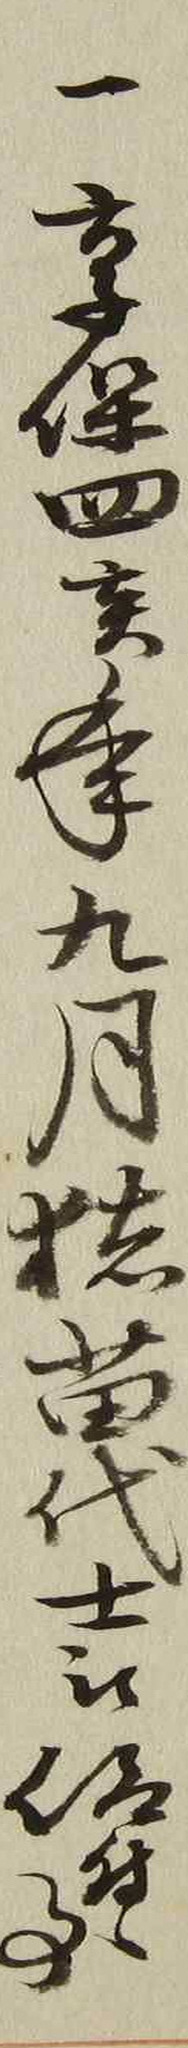一享保四亥年九月猪苗代士被仰付候事
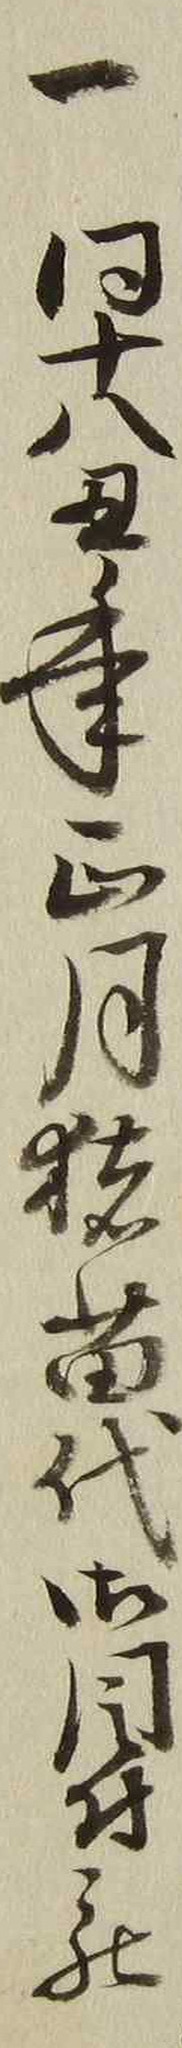一同十八丑年正月猪苗代御目付被
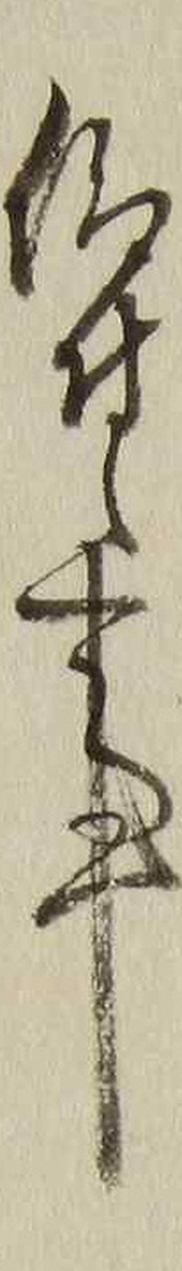仰付候事
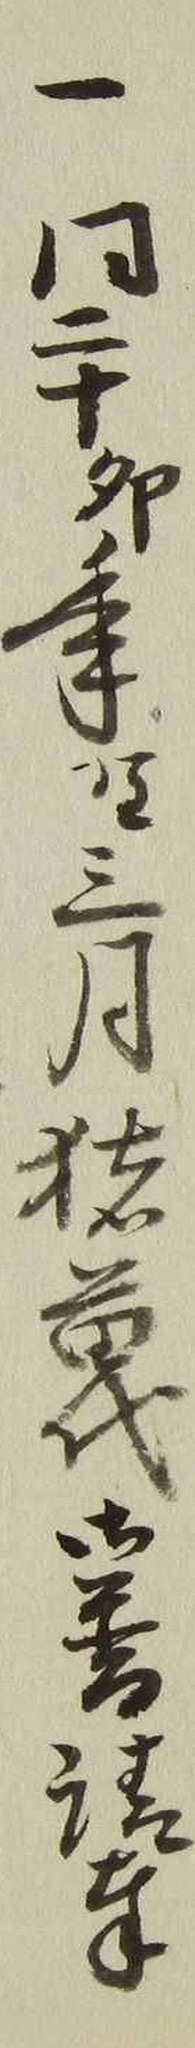一同二十卯年閏三月猪苗代御普請奉
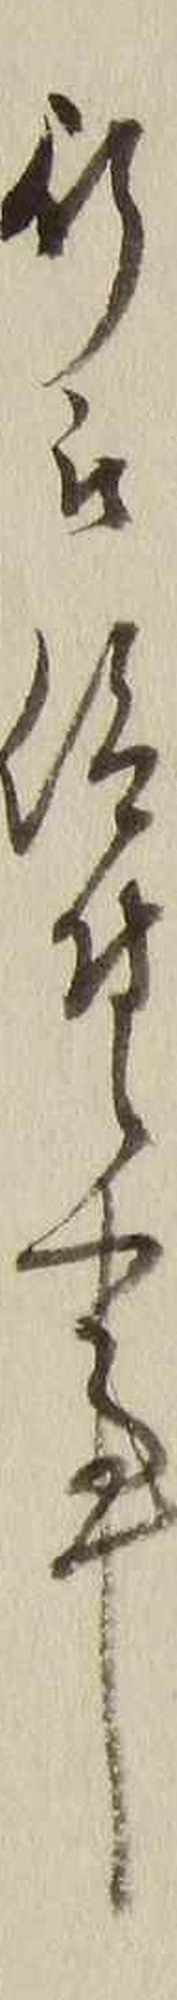行被仰付候事
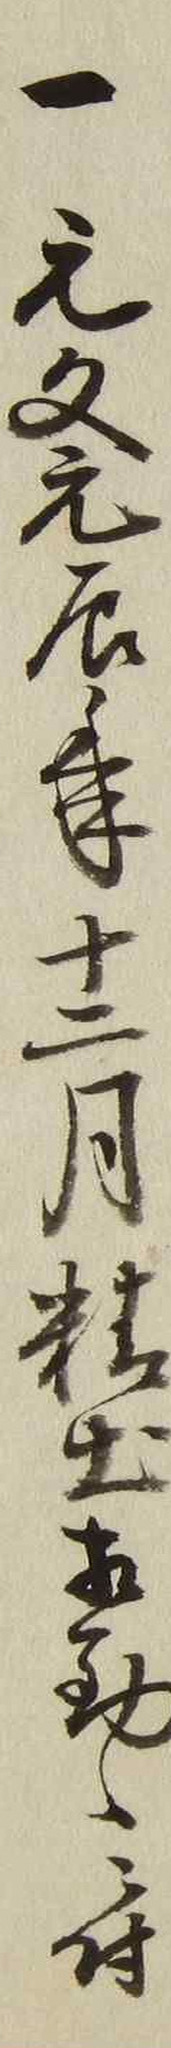一元文元辰年十二月精出相勤候ニ付
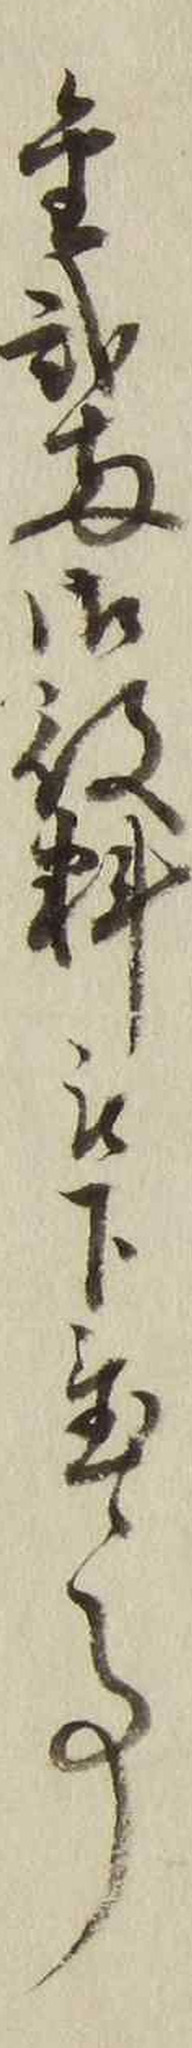金弐両御役料被下置候事
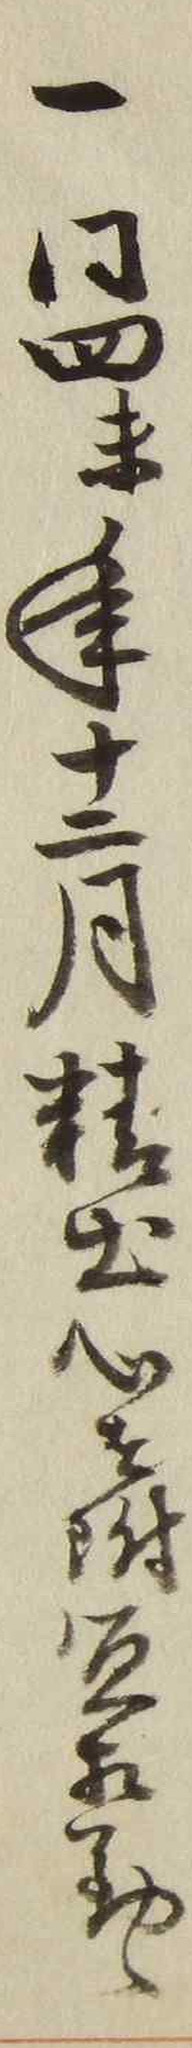一同四未年十二月精出心を附宜相勤候

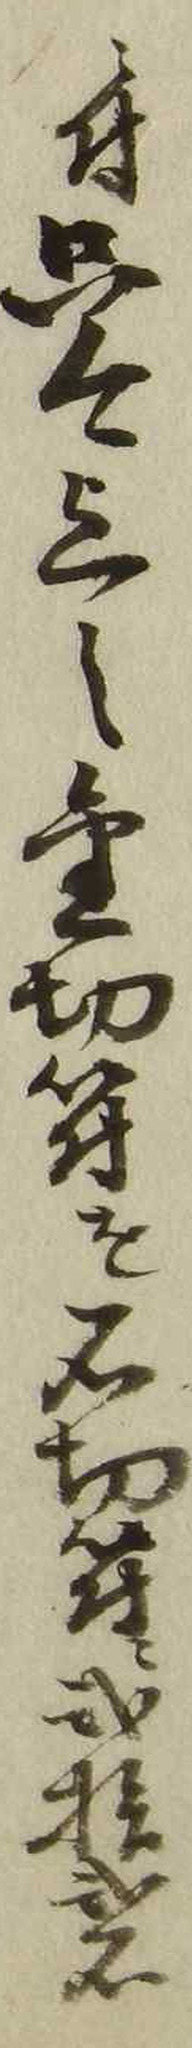ニ付只今之金切符を石切符ニ弐拾弐石
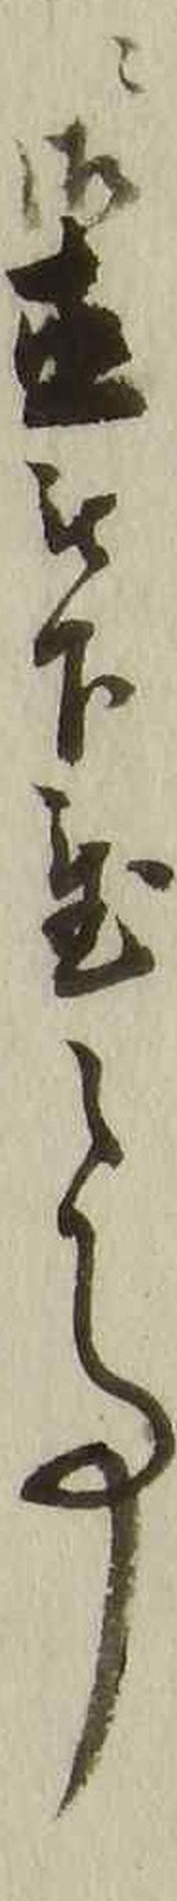御直被下置候事
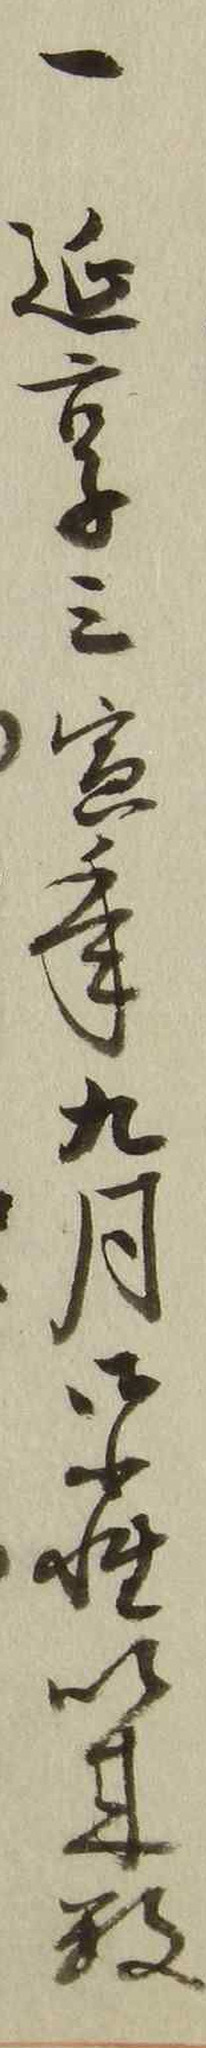一延享三寅年九月御小性以来致
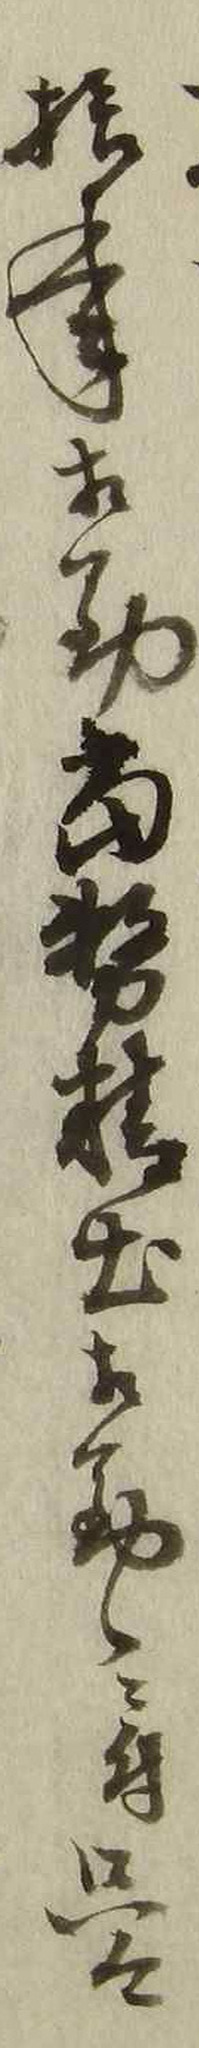拾年相勤当務精出相勤候ニ付只今
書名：諸士系譜　巻之53　に之部4
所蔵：会津若松市立会津図書館
